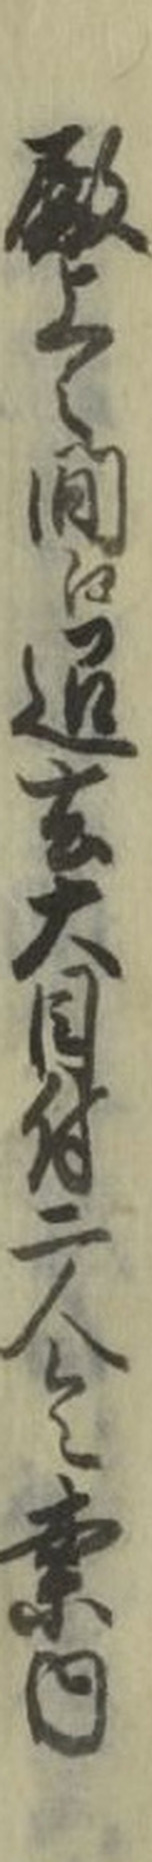殿上之間え退去大目付二人之案内
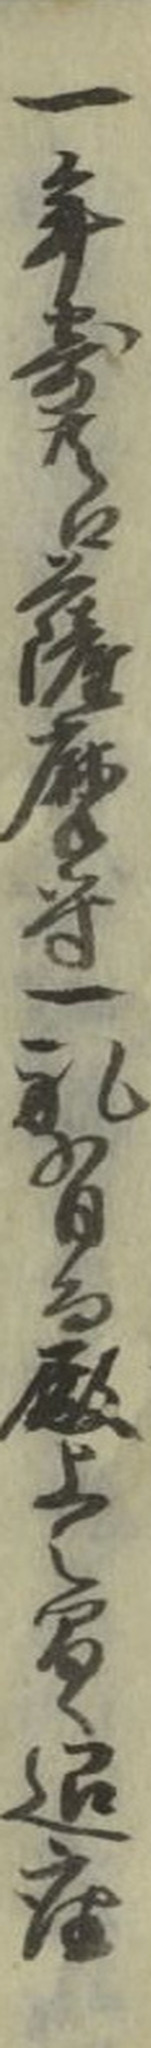一年寄共え薩摩守一礼有而殿上之間へ退座
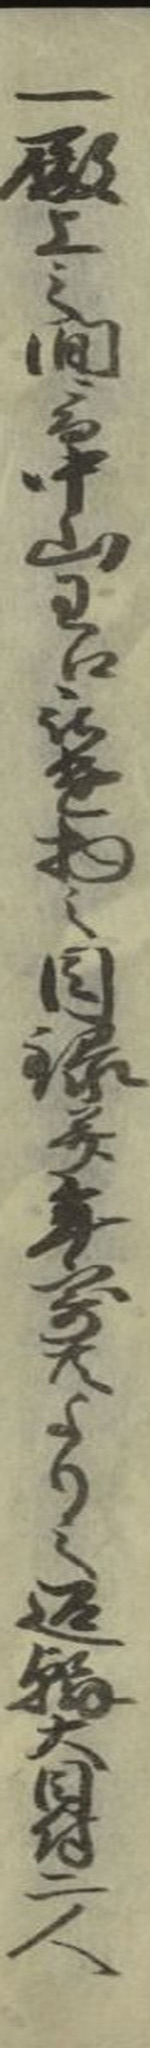一殿上之間に而中山王え披遣物之目録幷年寄共より之返翰大目付二人
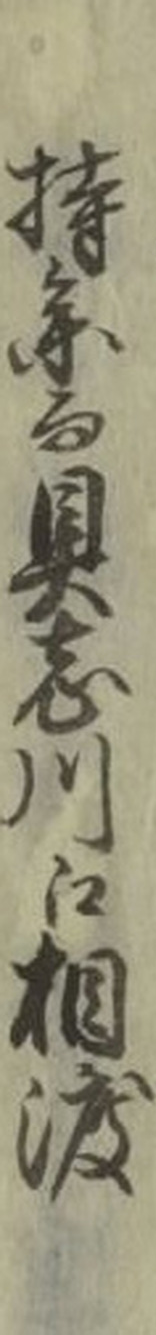持参而具志川え相渡
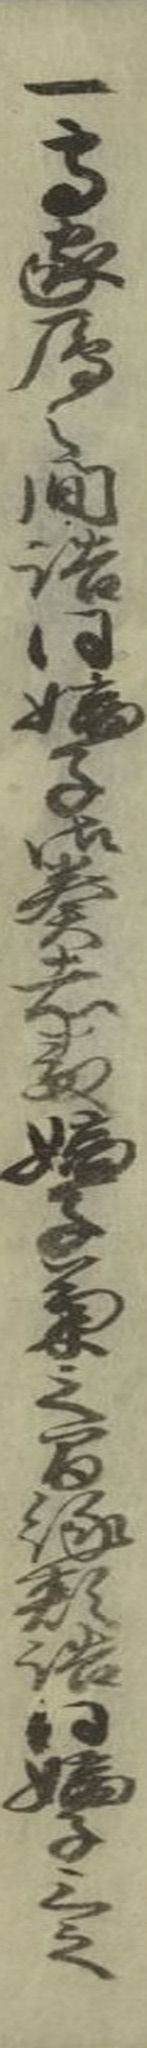一高家雁之間詰同嫡子御奏者番嫡子菊之間縁類詰同嫡子三之
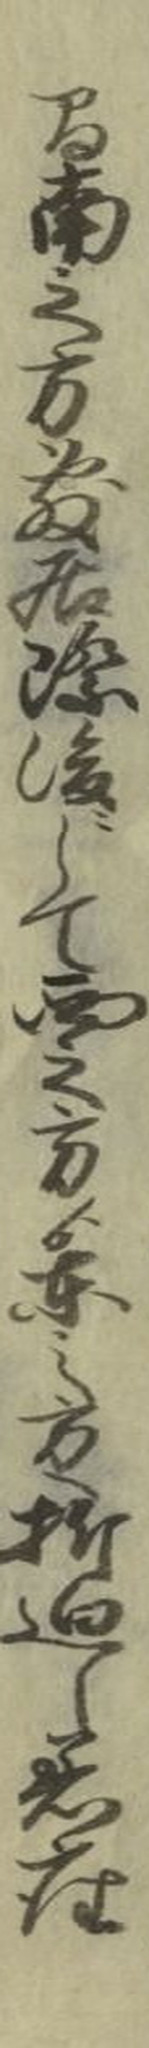間南之方敷居際後にして西之方ゟ東之方へ折廻し着座
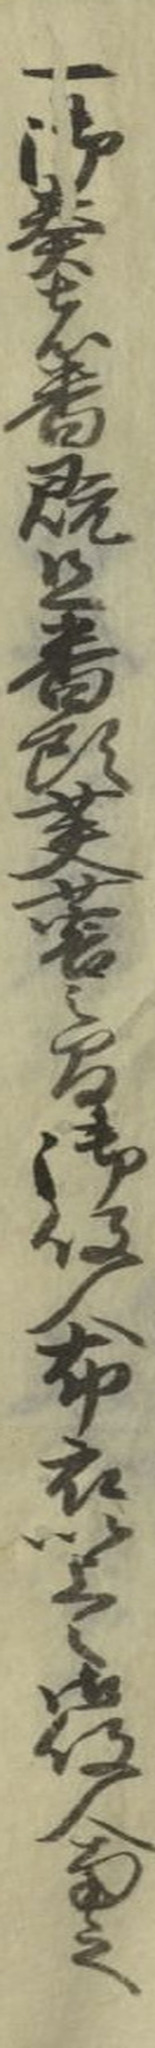一御奏者番既且番頭芙蓉之間御役人布衣以上之御役人南之
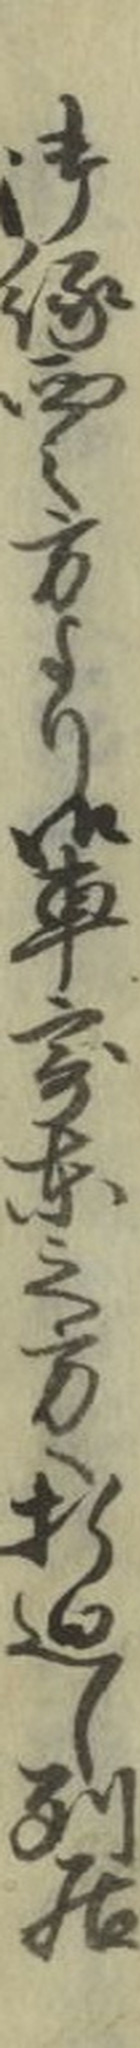御縁西之方より御車寄東之方へ折廻し列居
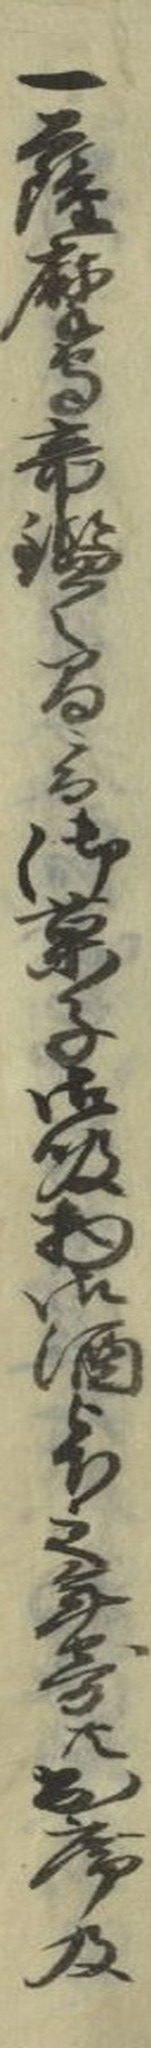一薩摩守帝鑑之間に而御菓子御吸物御酒被下之年寄共出席及
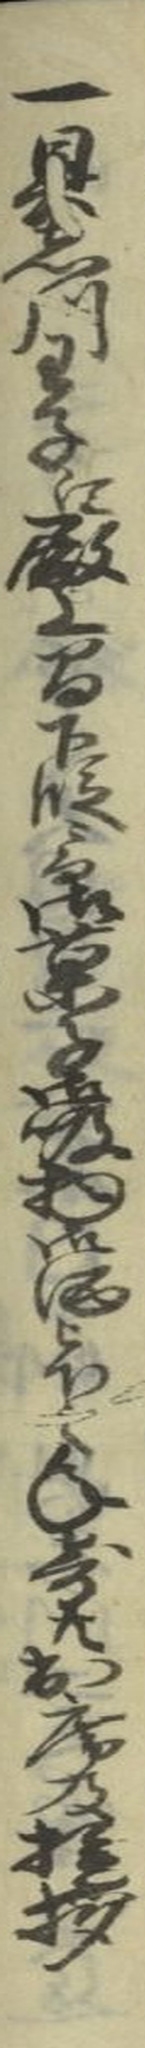一具志川王子え殿上之間下段に而御菓子御吸物御酒被下之年寄共及挨拶
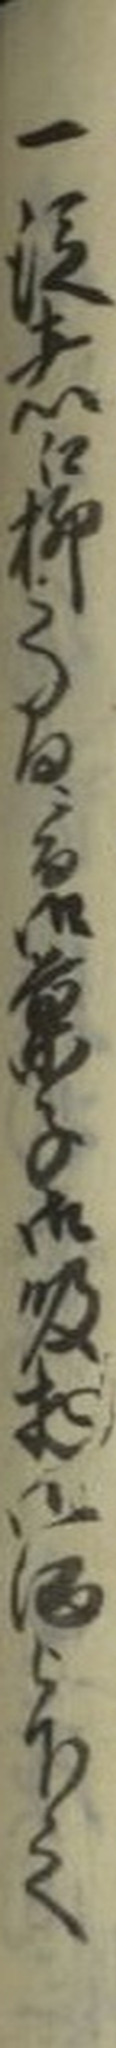一従者え柳之間に而御菓子御吸物御酒被下之
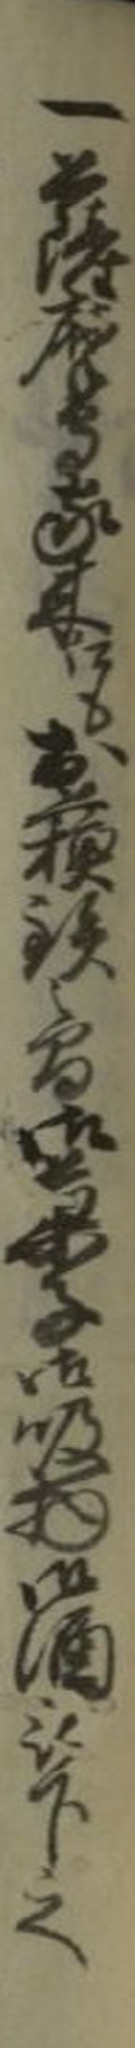一薩摩守家来にも於蘇鉄之間御菓子御吸物御酒被下之
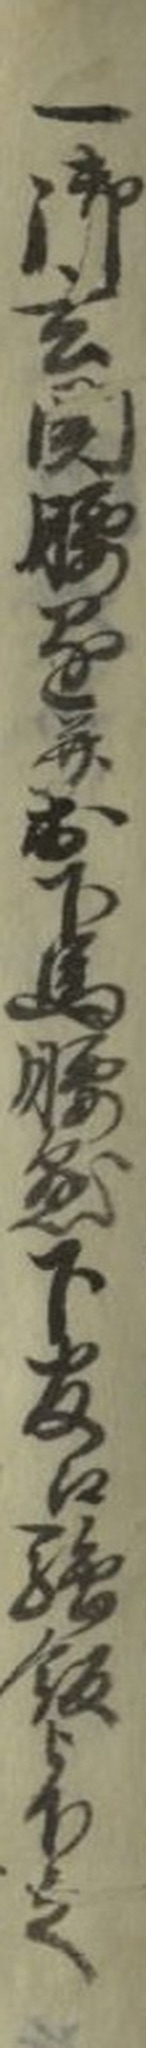一御玄関腰懸並於下馬腰懸下官え強飯被下之
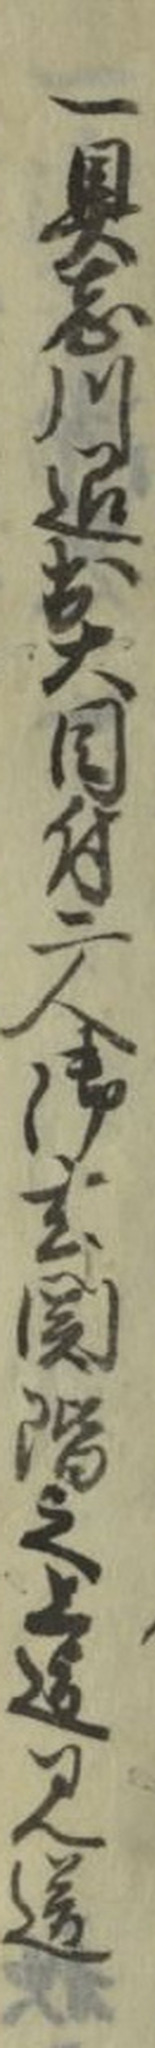一具志川退出大目付二人御玄関階之上迠見送
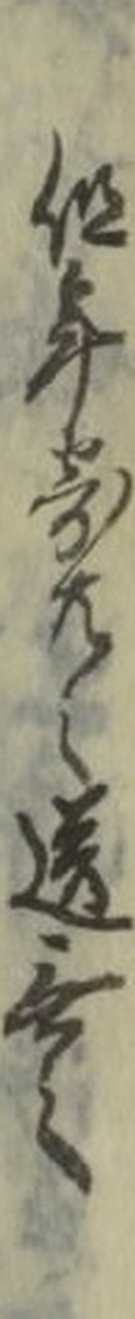但年寄共之送無之
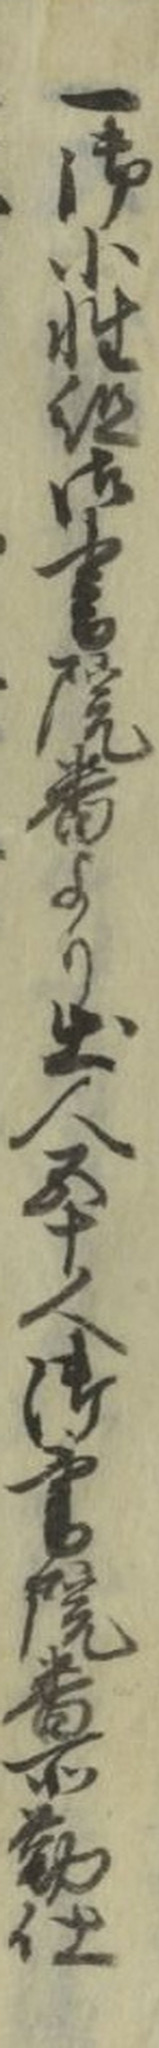一御小姓組御書院番より出人五十人御書院番所勤仕
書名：琉球人来朝之記
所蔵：University of the Ryukyus Library
